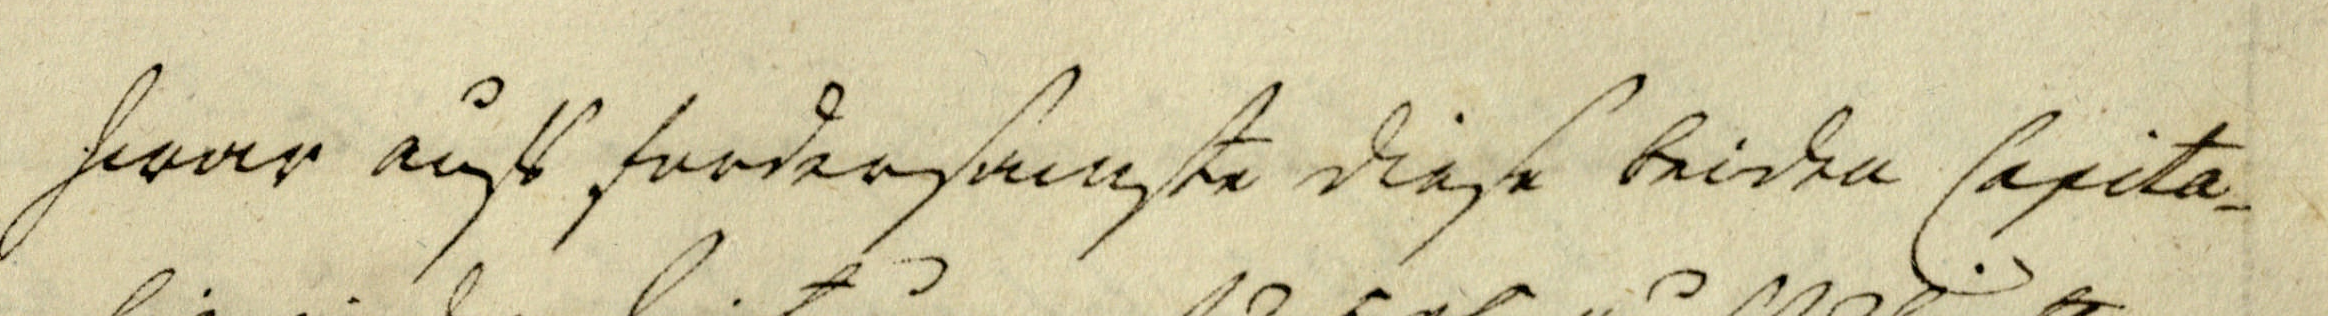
zwar aufs fordersamste diese beiden Capita¬
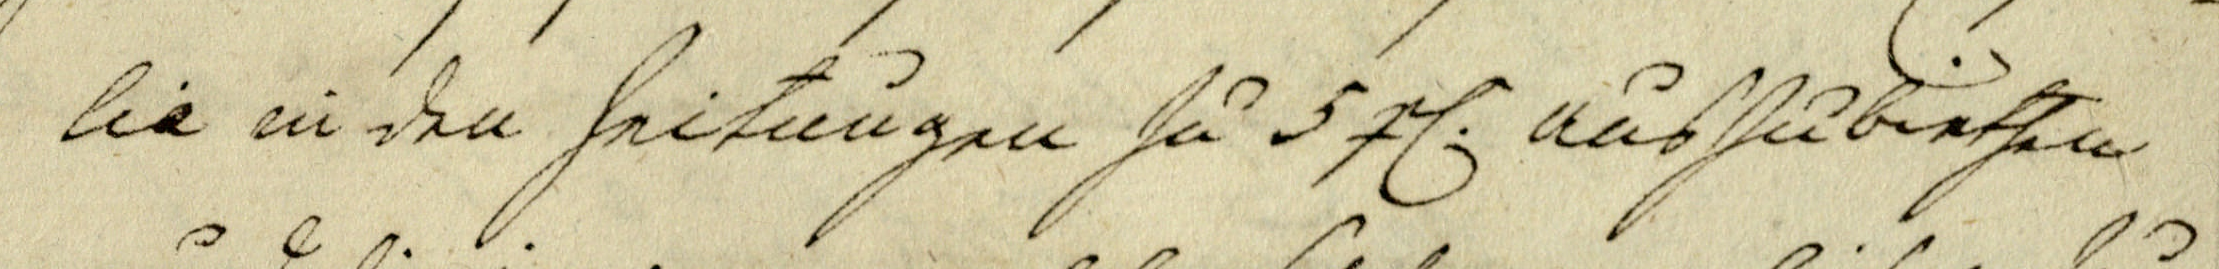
lia in den Zeitungen zu 5 pl. auszubiethen
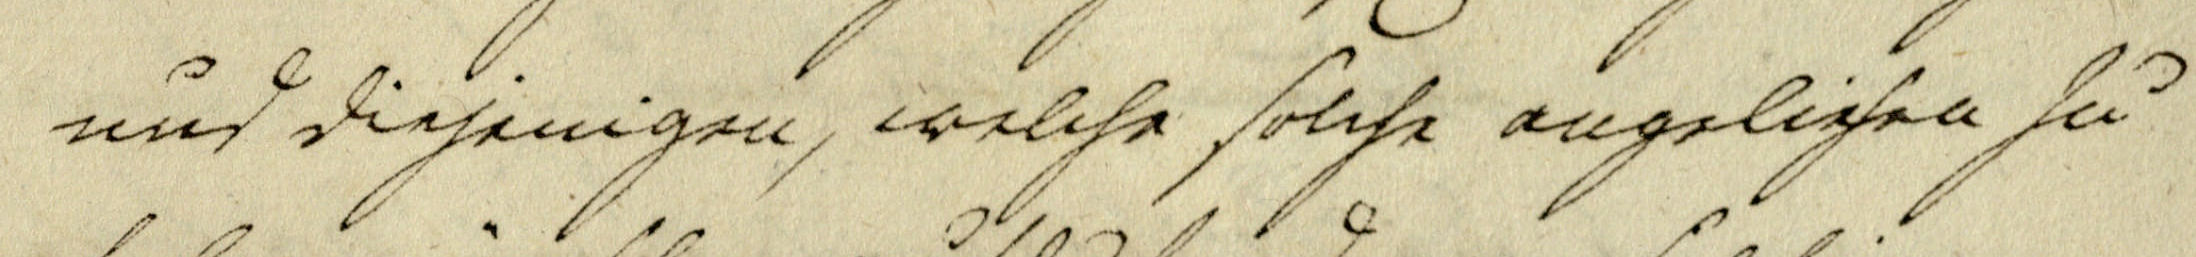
und diejenigen, welche solche angeliehen zu
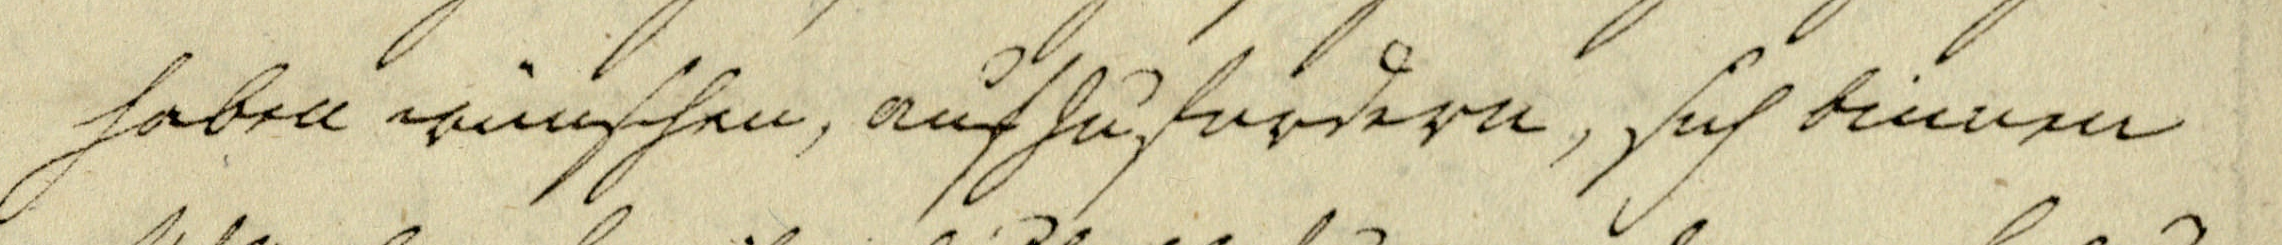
haben wünschen, aufzufordern, sich binnen
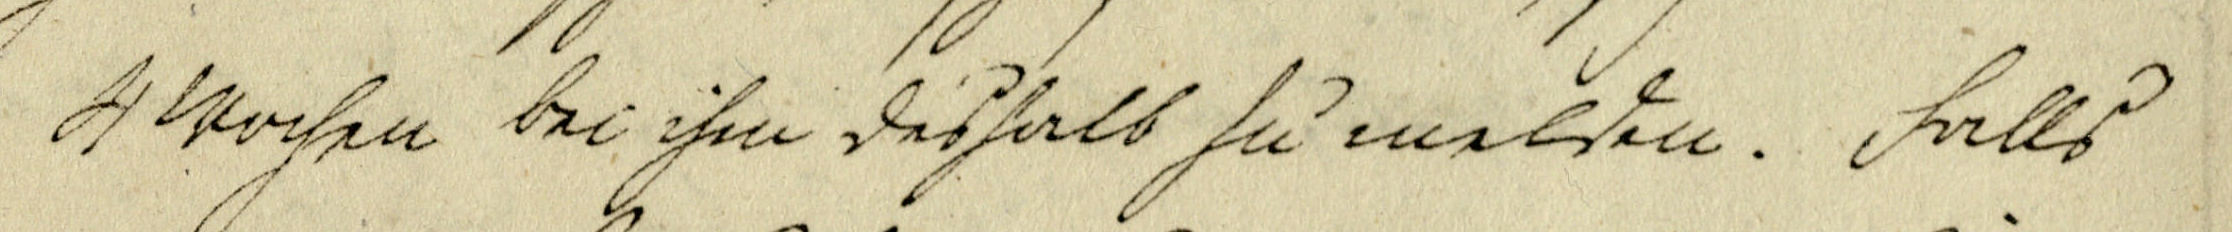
4 Wochen bei ihm deshalb zu melden. Falls
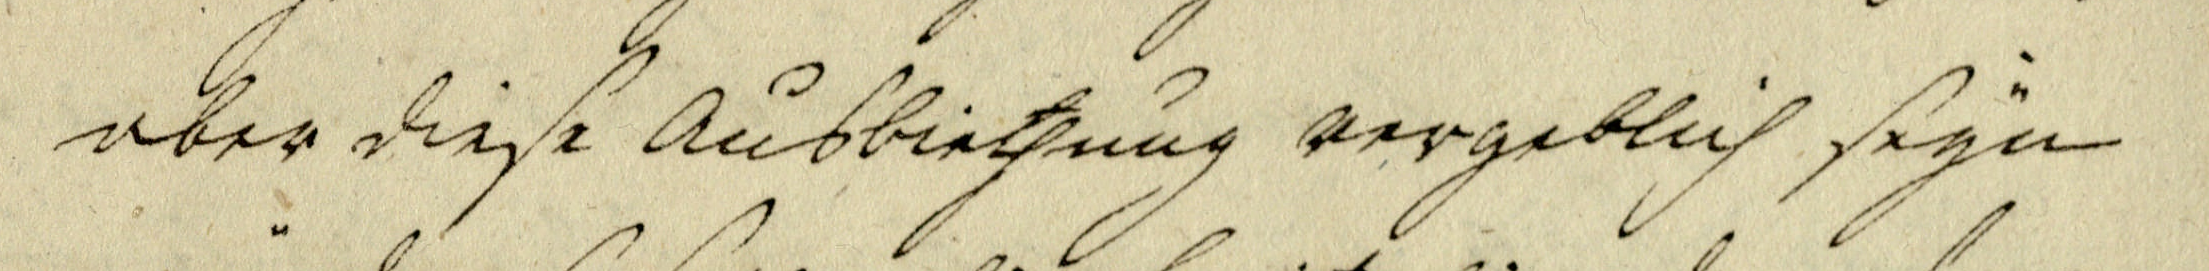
aber diese Ausbiethung vergeblich seÿn
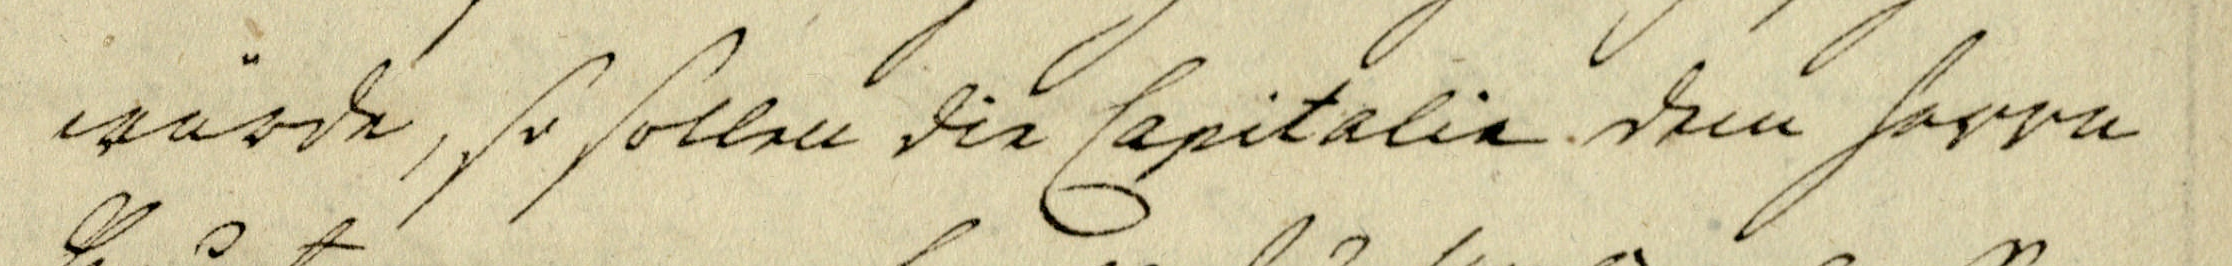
würde, so sollen die Capitalia dem Herrn
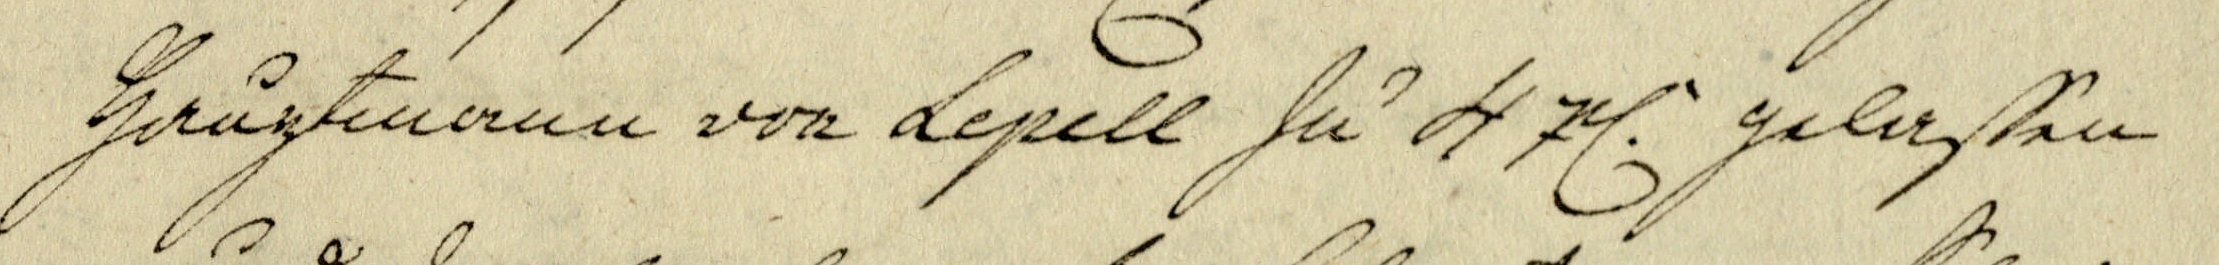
Hauptmann von Lepell zu 4 pl. gelassen
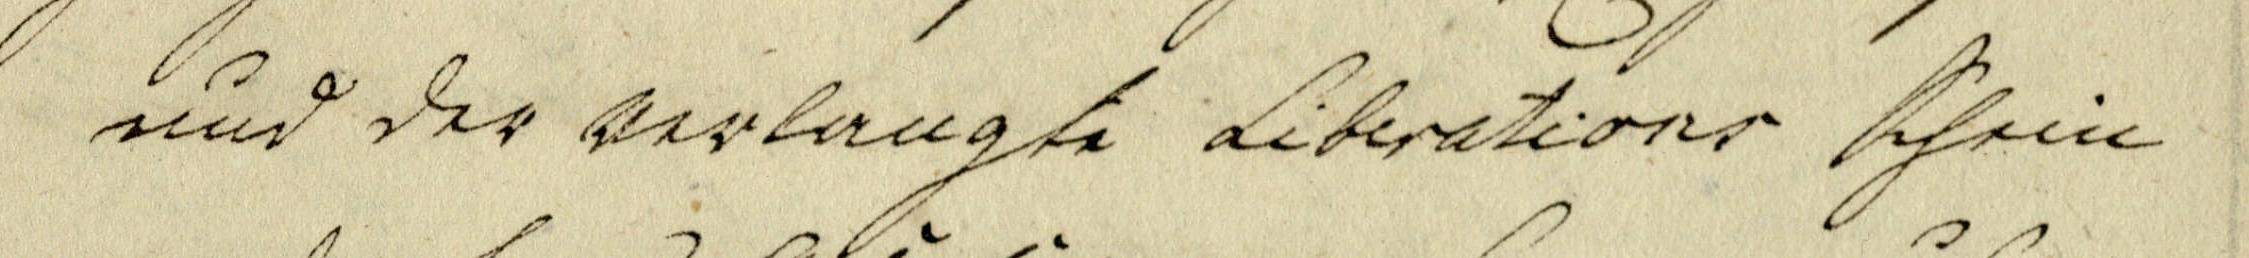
und der verlangte Liberations Schein
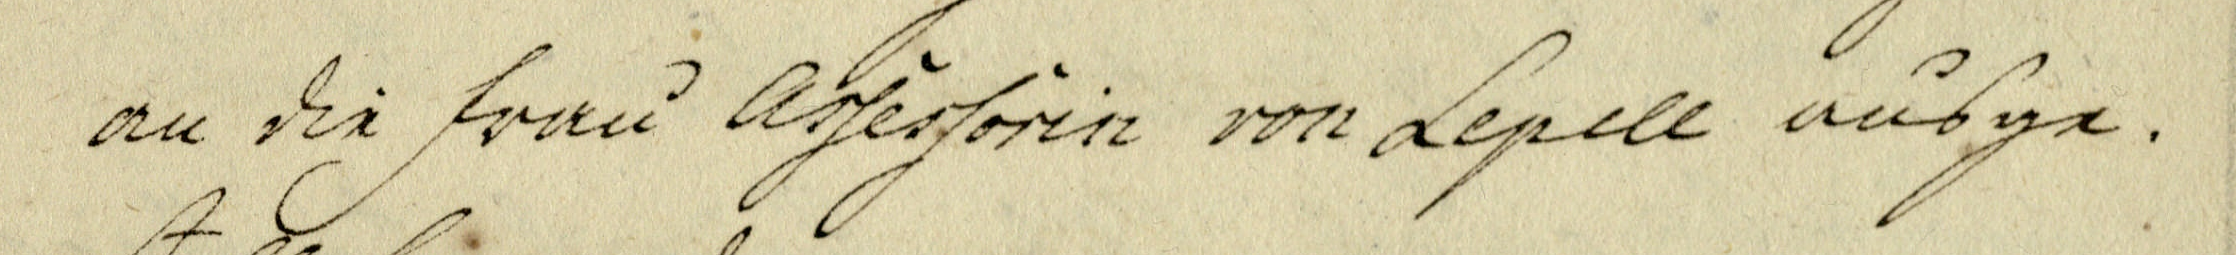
an die Frau Assessorin von Lepell ausge¬
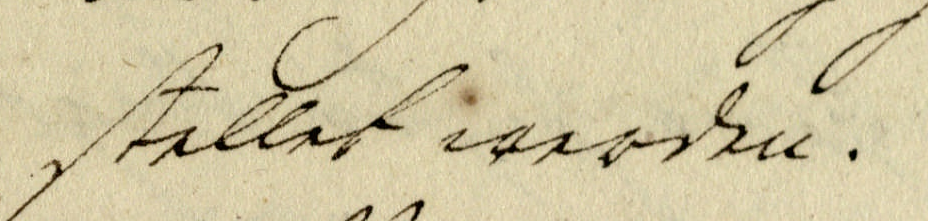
stellet werden.
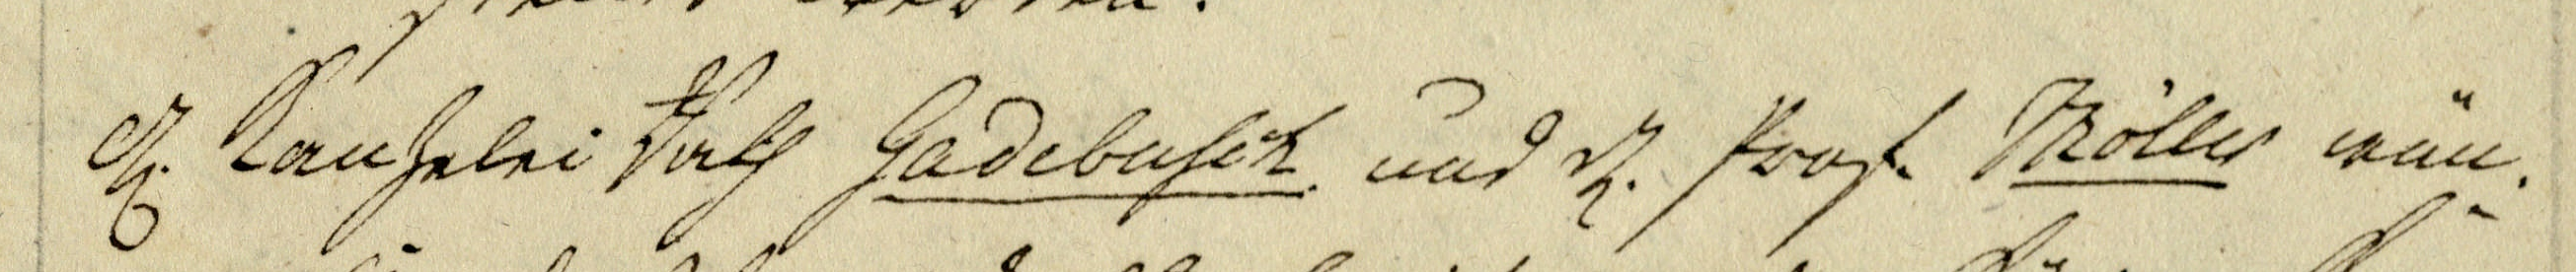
dh. Kanzelei Rath Gadebusch und dh. Prof. Möller wün
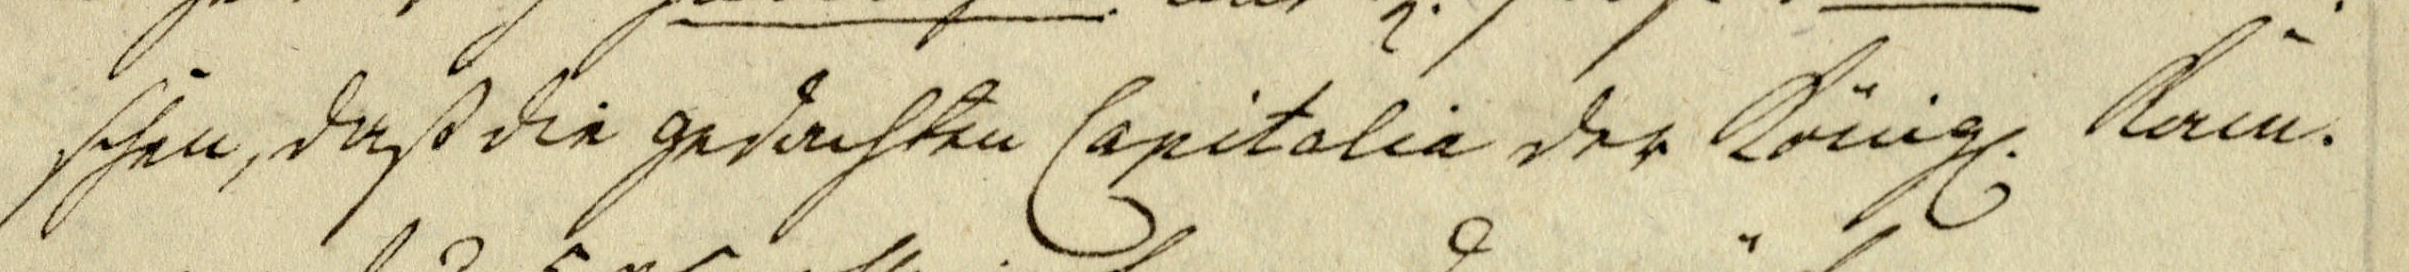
schen, daß die gedachten Capitalia der Königl. Kam¬
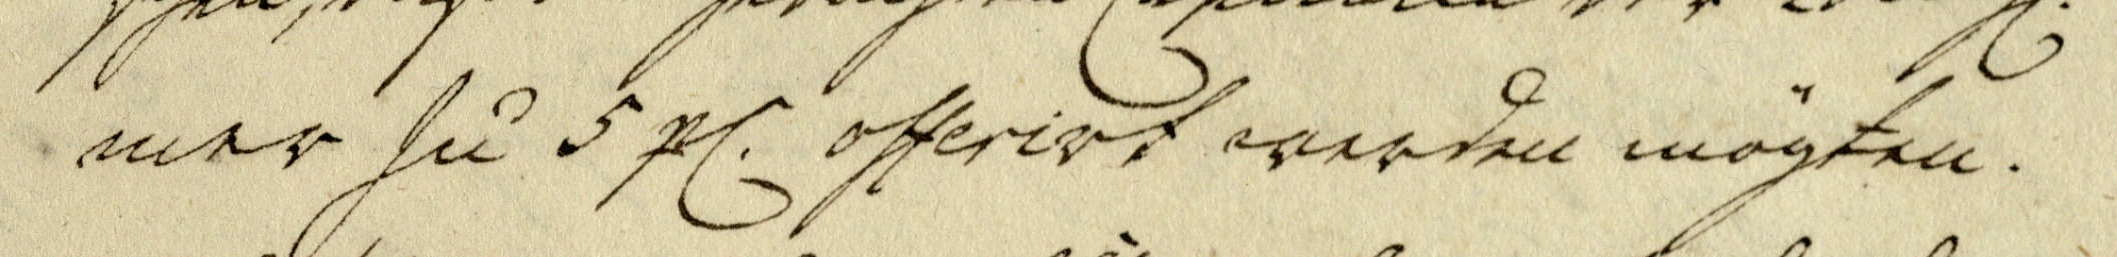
mer zu 5 pl. offerirt werden mögten.
